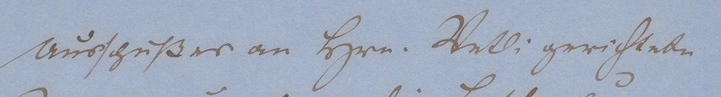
ausschußes an Hrn. Wetli gerichtete
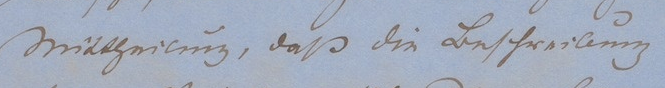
Mittheilung, daß die Beschreibung
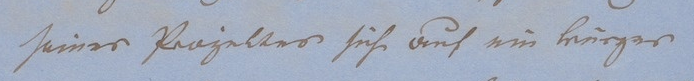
seines Projektes sich auf ein kurzes
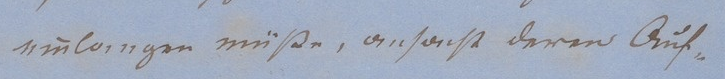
einlangen müße, ansonst deren Auf-
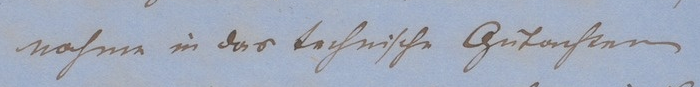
nahme in das technische Gutachten
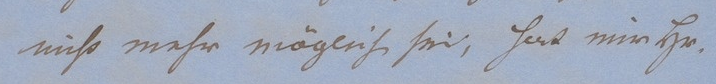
nicht mehr möglich sei, hat mir Hr.
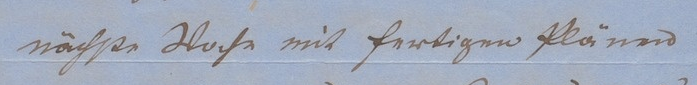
nächste Woche mit fertigen Plänen
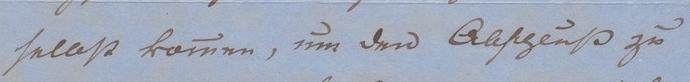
selbst kommen können, um den Abschluß zu
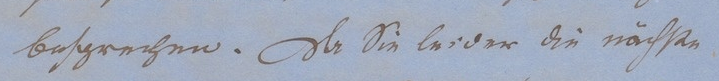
besprechen. Da Sie leider die nächste
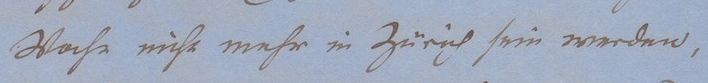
Woche nicht mehr in Zürich sein werden,
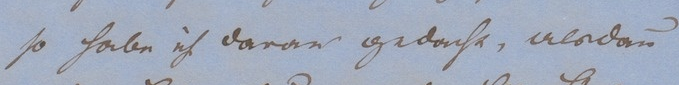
so habe ich daran gedacht, als dann
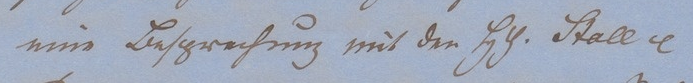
eine Besprechung mit den Hh. Stoll &
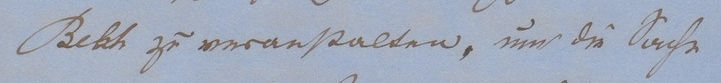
Bekh zu veranstalten, um die Sache
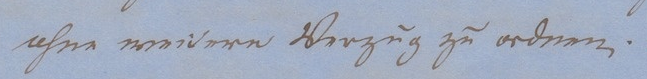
ohne weitern Verzug zu ordnen. –
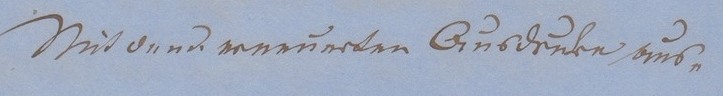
Mit dem erneuerten Ausdruke aus-
